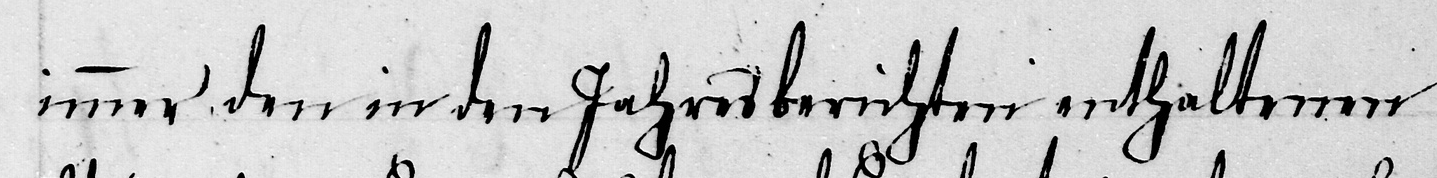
immer den in den Jahresberichten enthaltenen
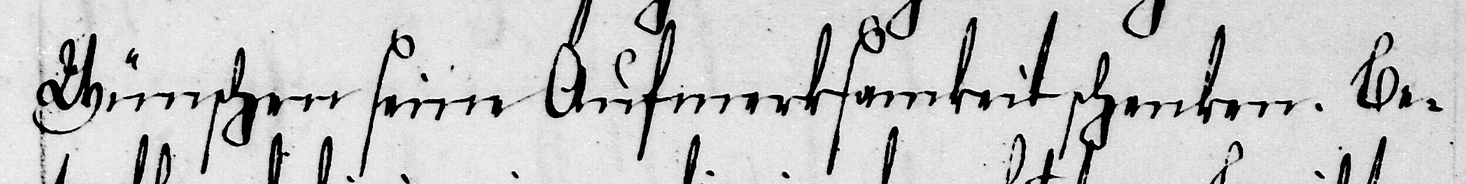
Wünschen seine Aufmerksamkeit schenken. Be¬
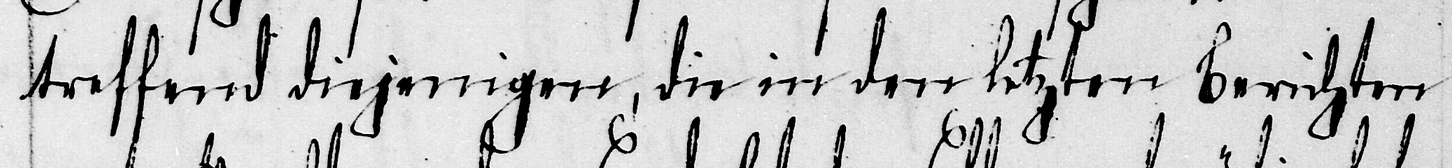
treffend diejenigen, die in den letzten Berichten
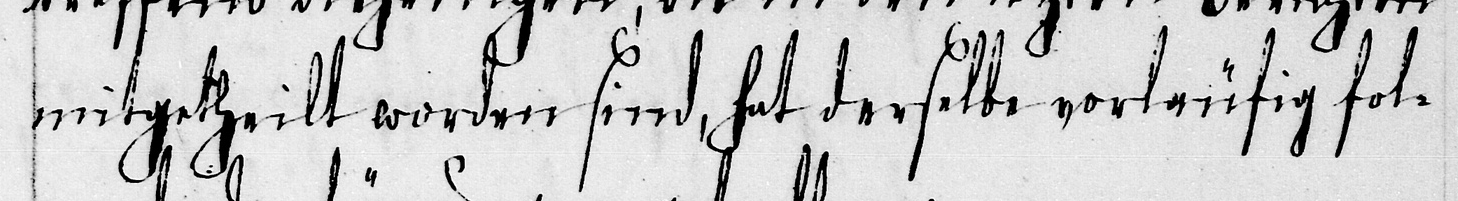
mitgetheilt worden sind, hat derselbe vorläufig fol¬
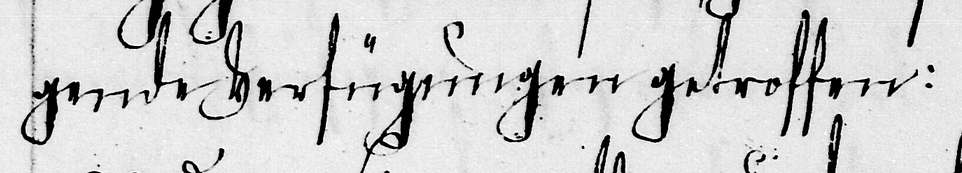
gende Verfügungen getroffen:
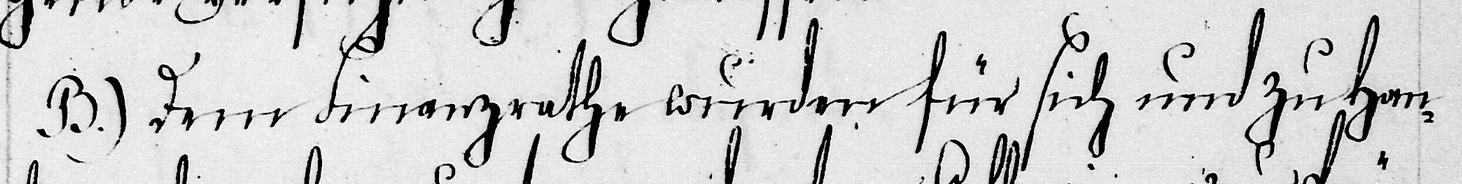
B.) Dem Finanzrathe wurden für sich und zu Han¬
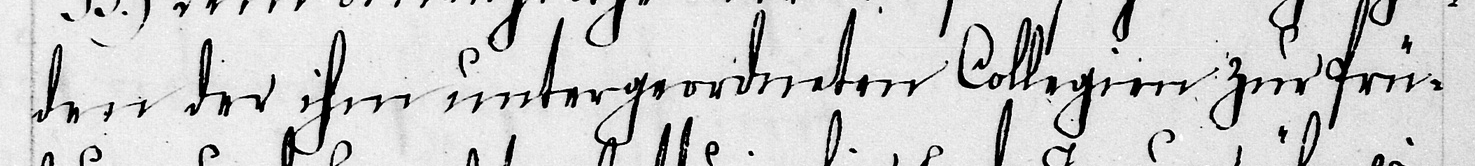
den der ihm untergeordneten Collegien zur Prü¬
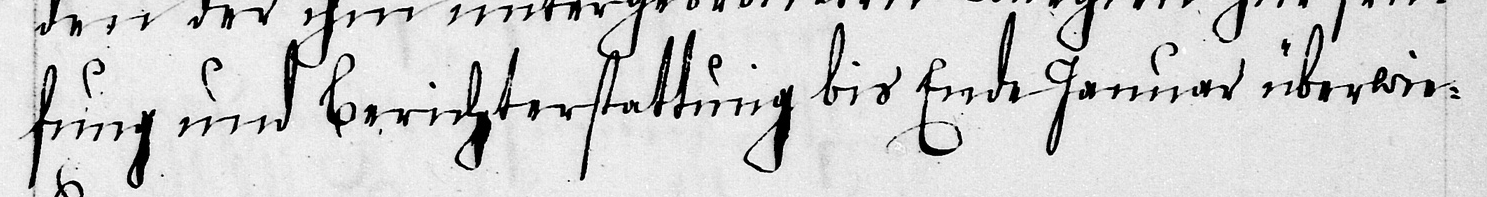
fung und Berichtserstattung bis Ende Januar überwie¬
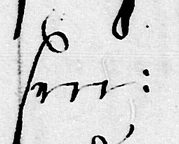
sen:
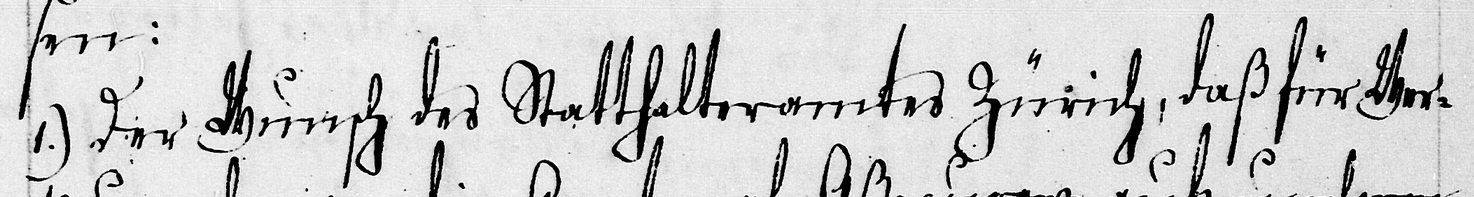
1.) Der Wunsch des Statthalteramtes Zürich, daß für Wer¬
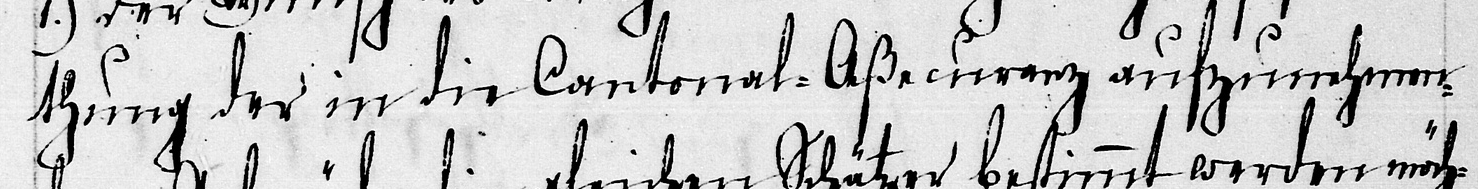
thung der in die Cantonal-Aßecuranz aufzunehmen¬
